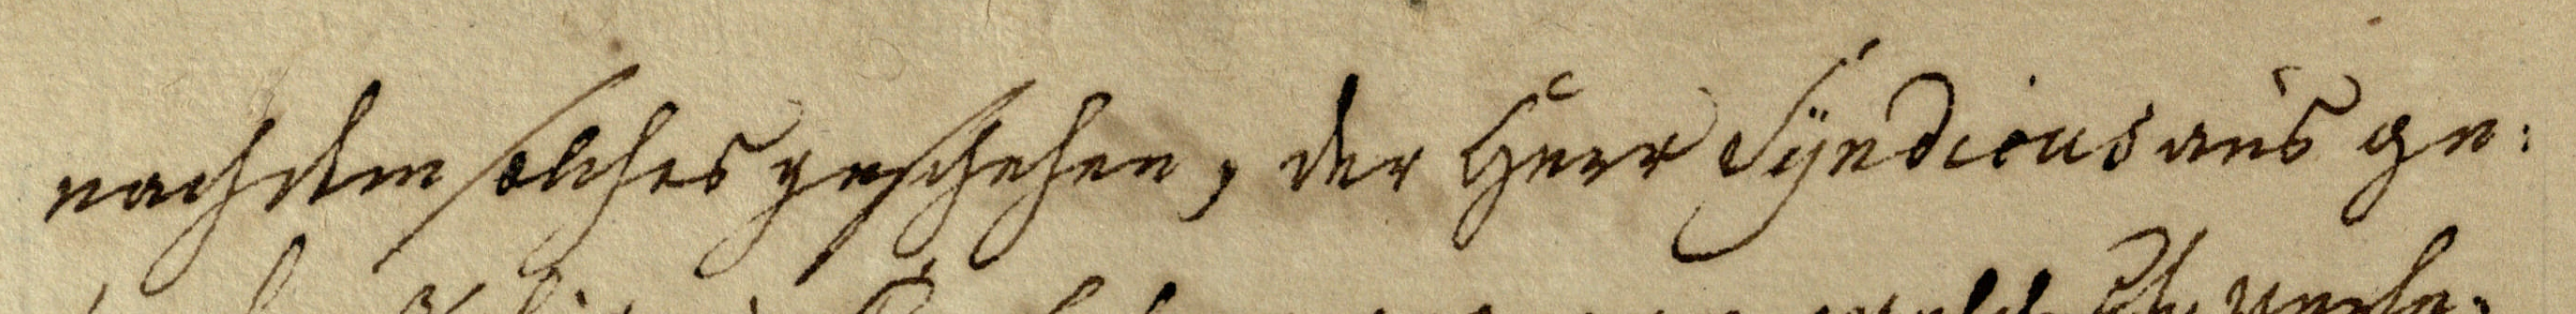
nachdem solches geschehen, der Herr Sÿndicus aus ge¬
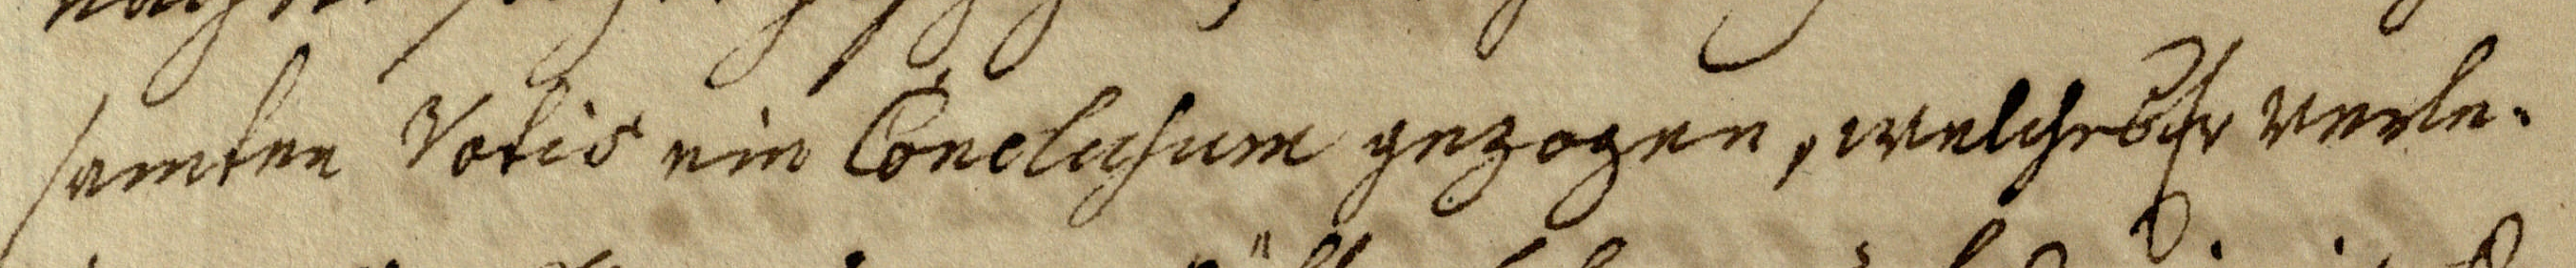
samten Votis ein Conclusum gezogen, welches Er verle¬
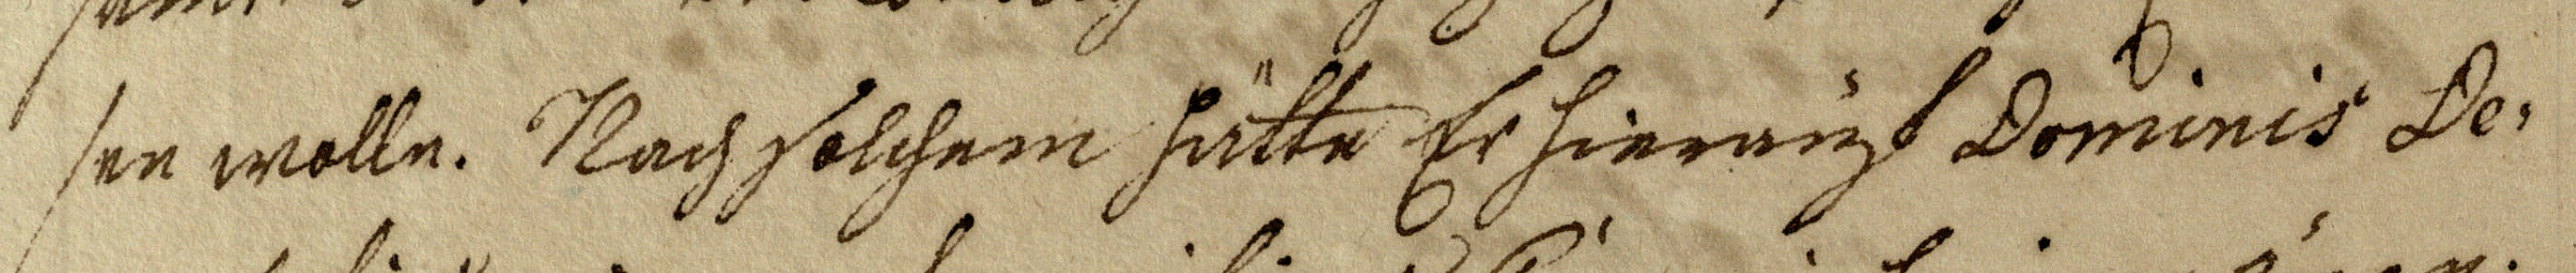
sen wolle. Nach solchem hätte Er hierauf Dominis De¬
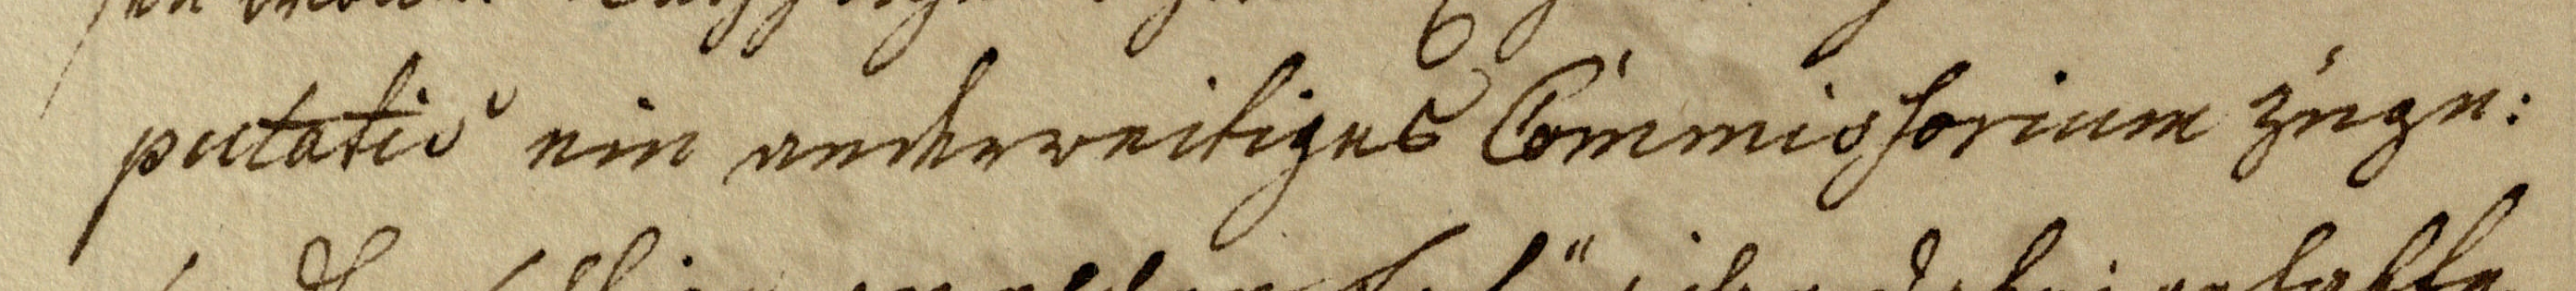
putatis ein anderweitiges Commissorium zuge¬
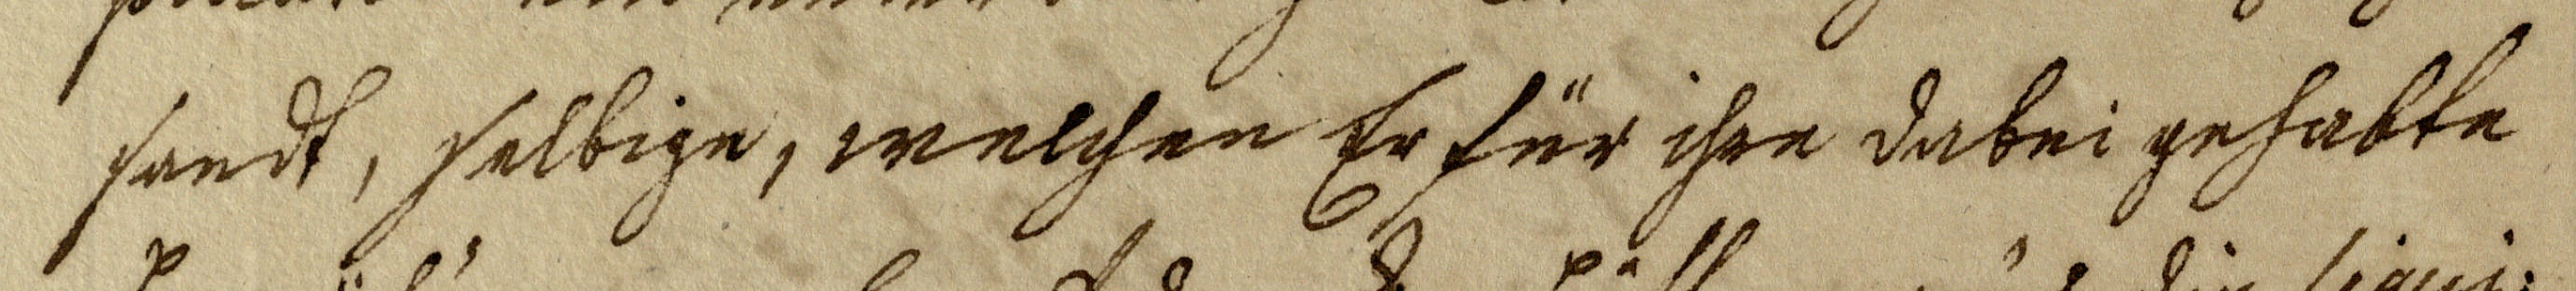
sandt, selbige, welchen Er für ihre dabei gehabte
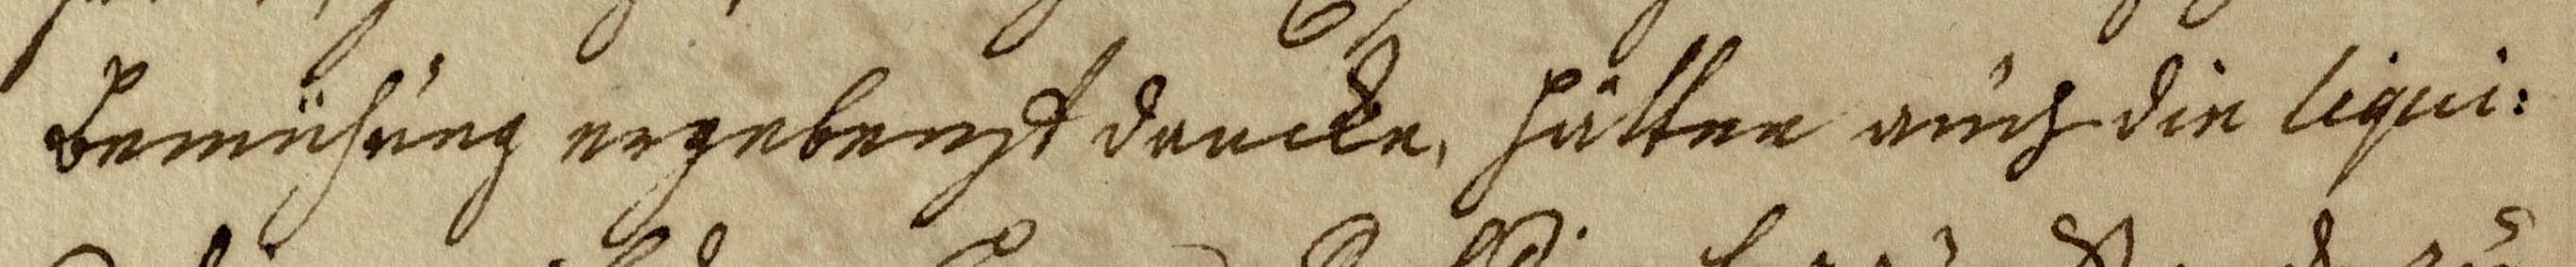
Bemühung ergebenst danke, hätten auch die liqui¬
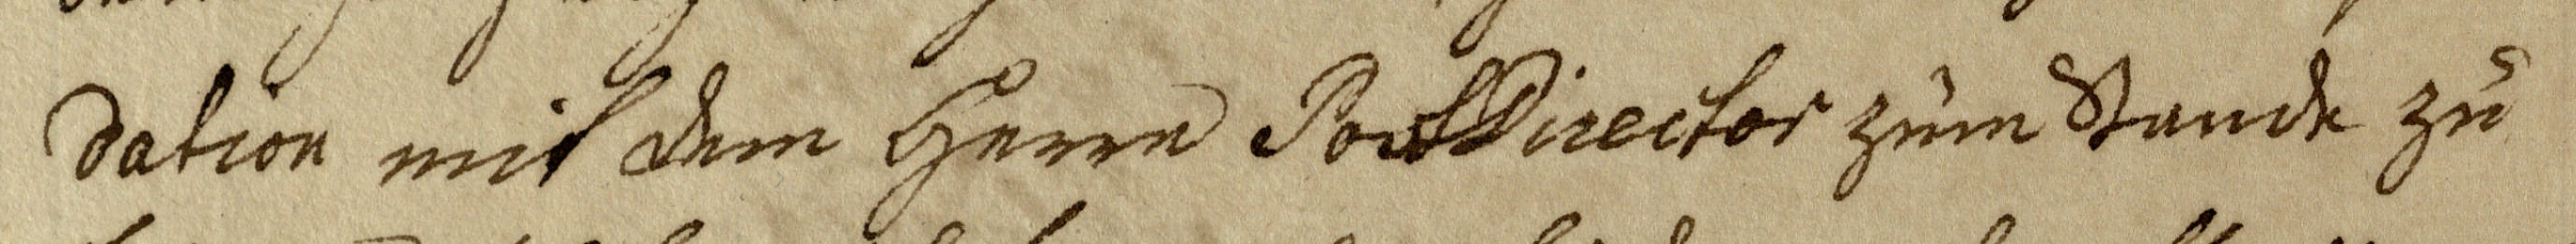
dation mit dem Herrn PostDirector zum Stande zu
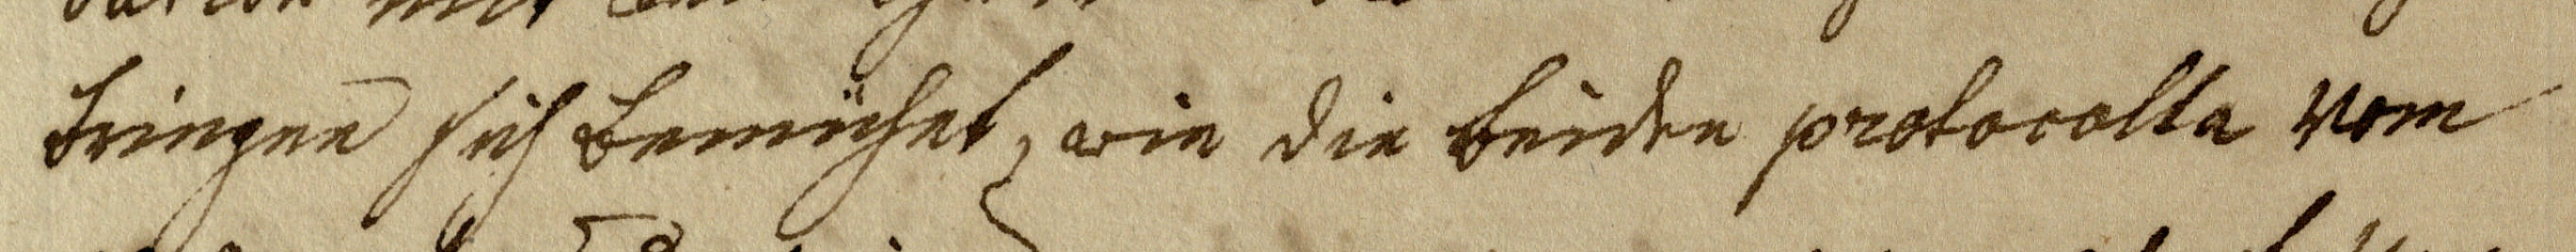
bringen sich bemühet, wie die beiden protocolle vom
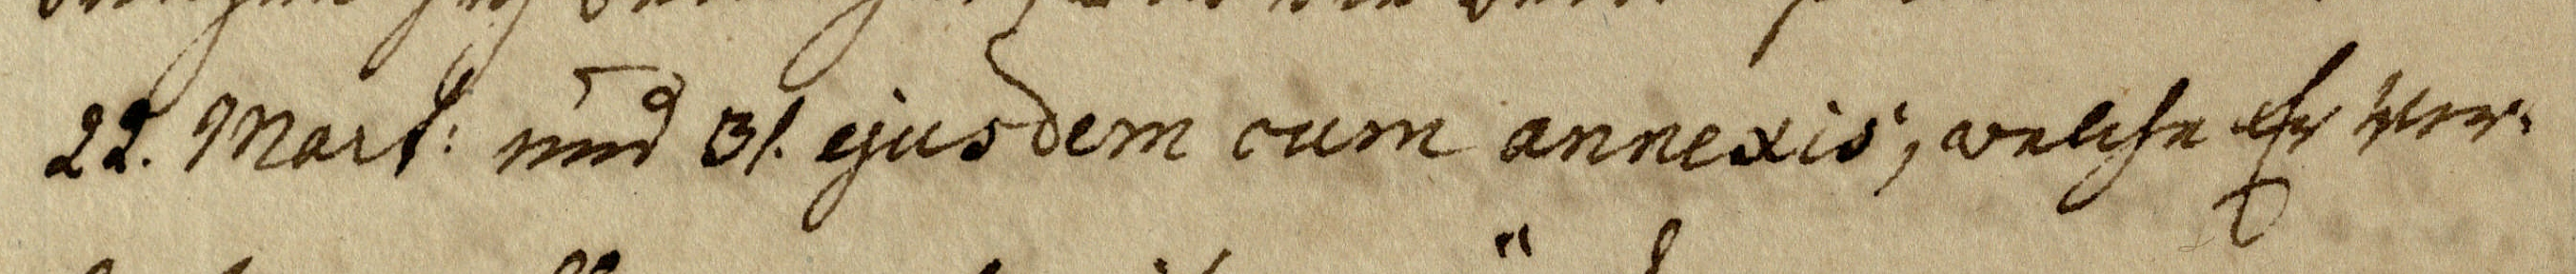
22. Mart. und 31. ejusdem cum annexis, welche Er ver¬
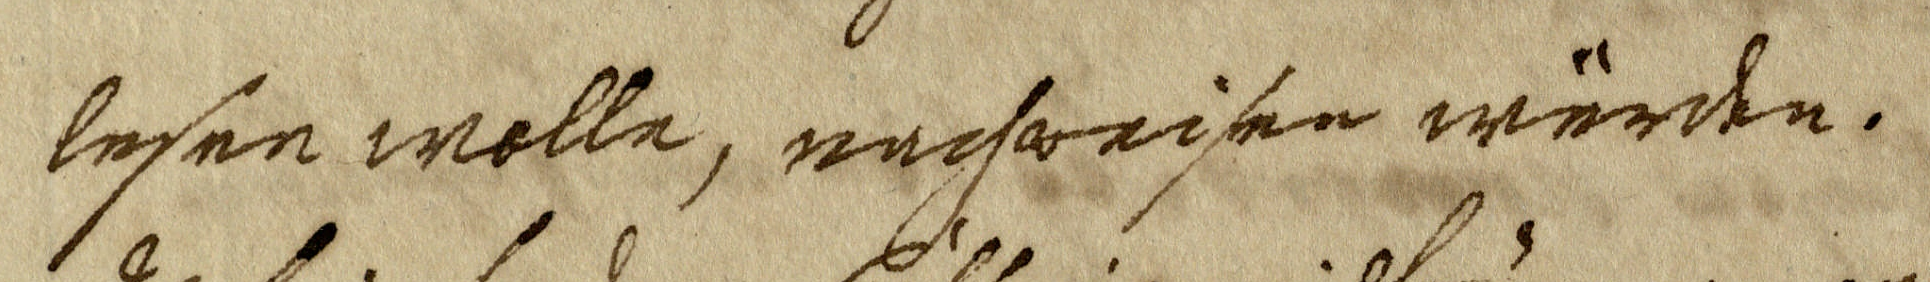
lesen wolle, nachweisen würden.
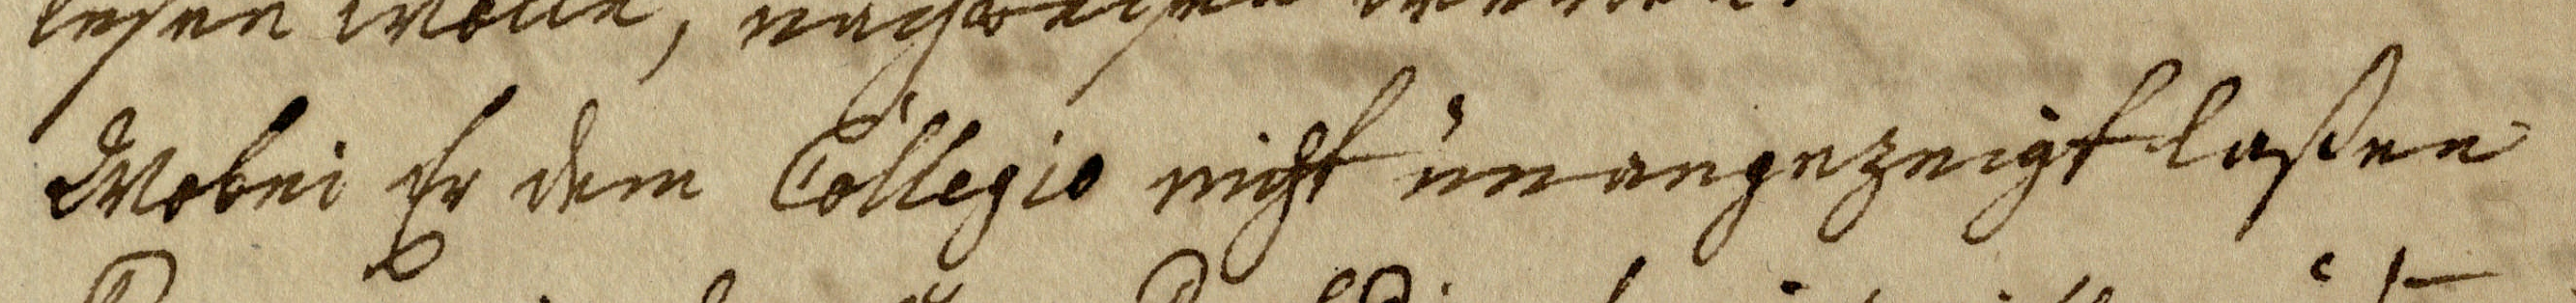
Wobei Er dem Collegio nicht unangezeigt laßen
